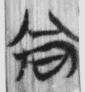尚
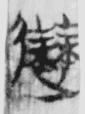速
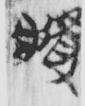○（瘥）
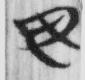母
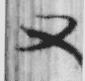又（有）
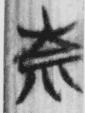柰
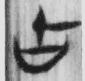占
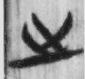之
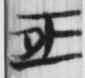亙（月？）
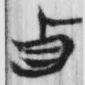貞
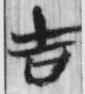吉
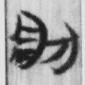○（病）
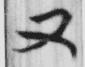又（有）
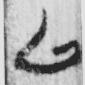㠯
